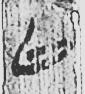㠯（以）
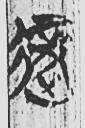復
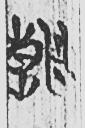朝
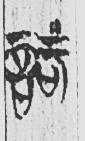訶
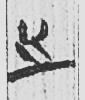之
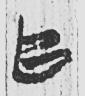𠂤
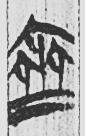齊
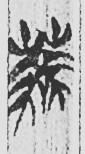蓑
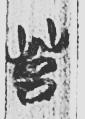芧
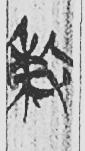殺
